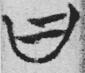曰
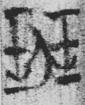班
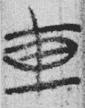車
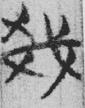○（衛）
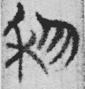利
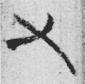又（有）
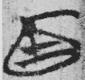○（攸）
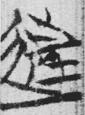○（往）
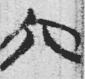六
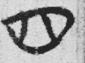四
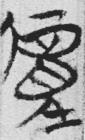僮（童）
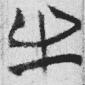牛
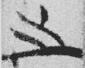之
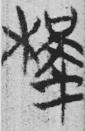○（牿）
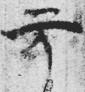元
